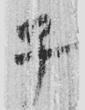子
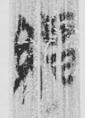○（治）
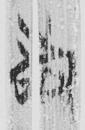○（詩）
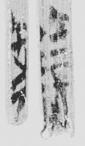箸（書）
